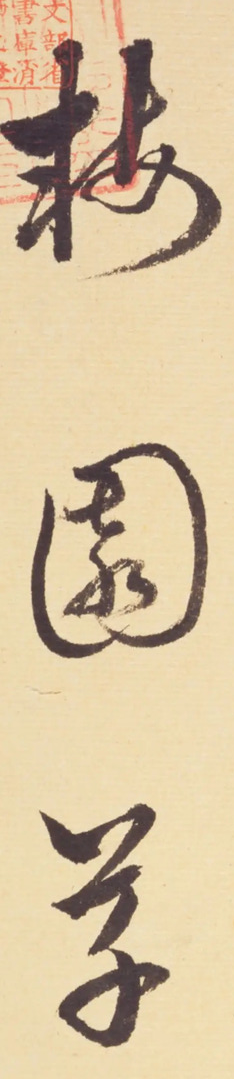梅園草
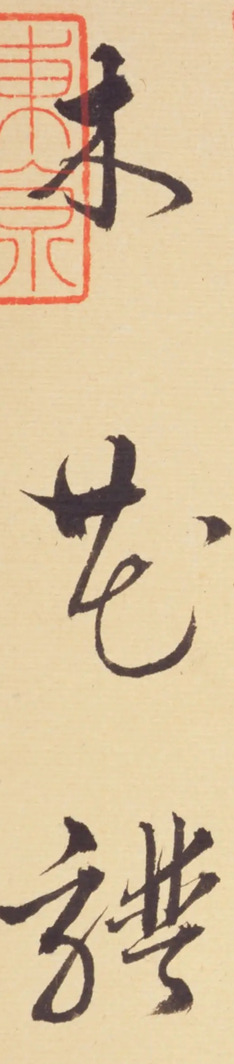木花譜
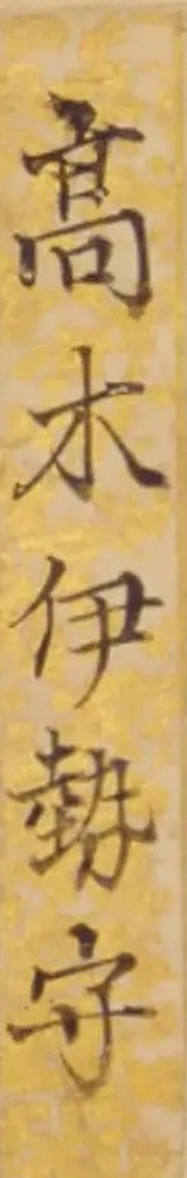高木伊勢守

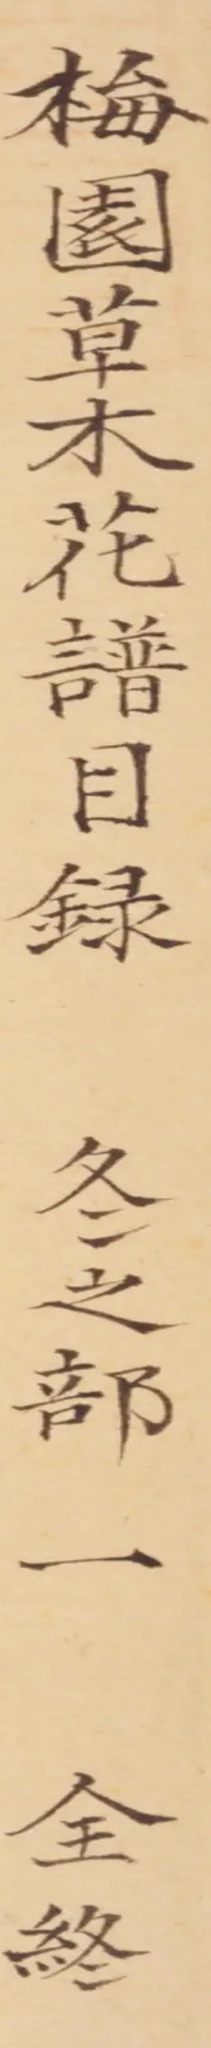梅園草木花譜目録冬之部一全終
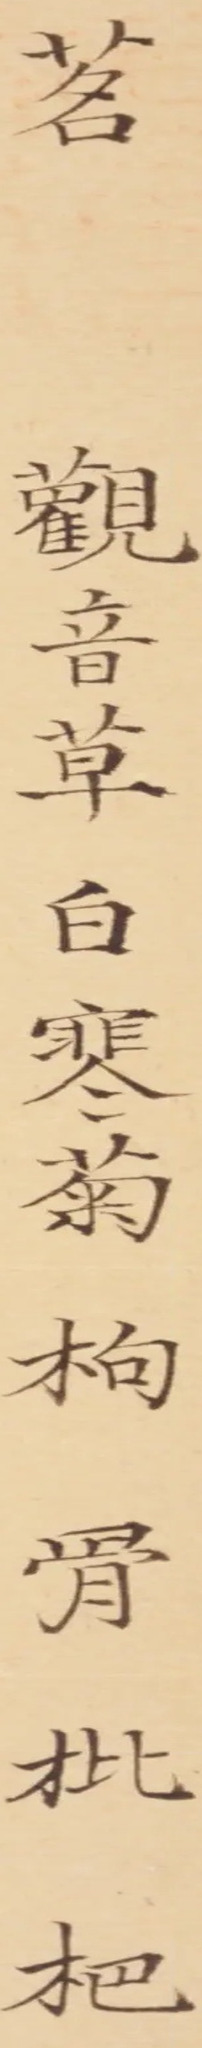茗観音草白寒菊枸骨枇杷
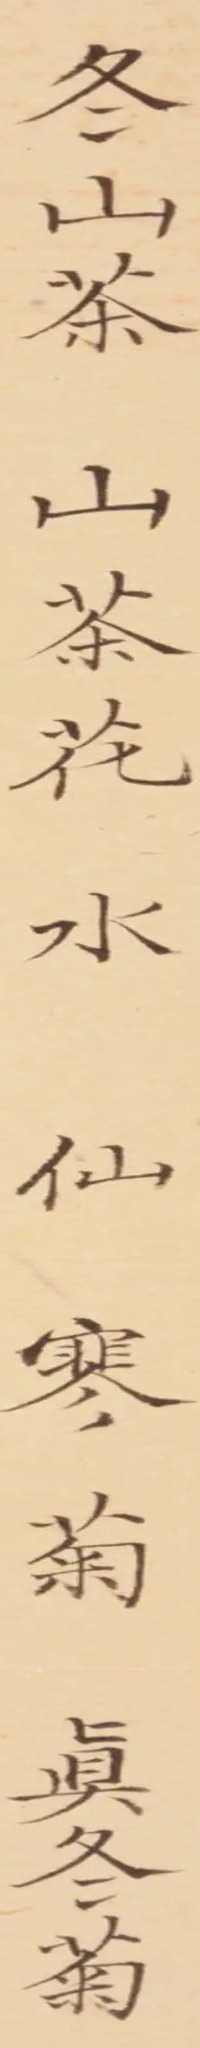冬山茶山茶花水仙寒菊真冬菊
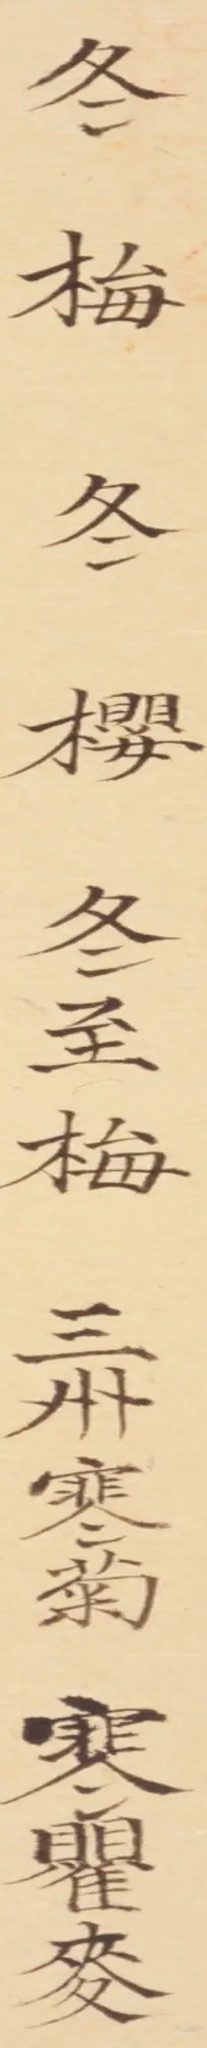冬梅冬桜冬至梅三州寒菊寒瞿麦
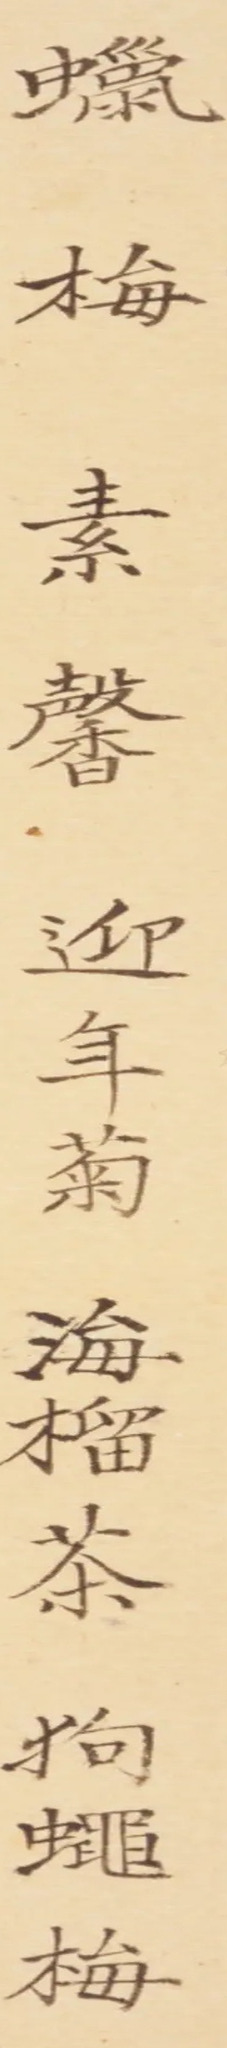蝋梅素馨迎年菊海榴茶狗蠅梅
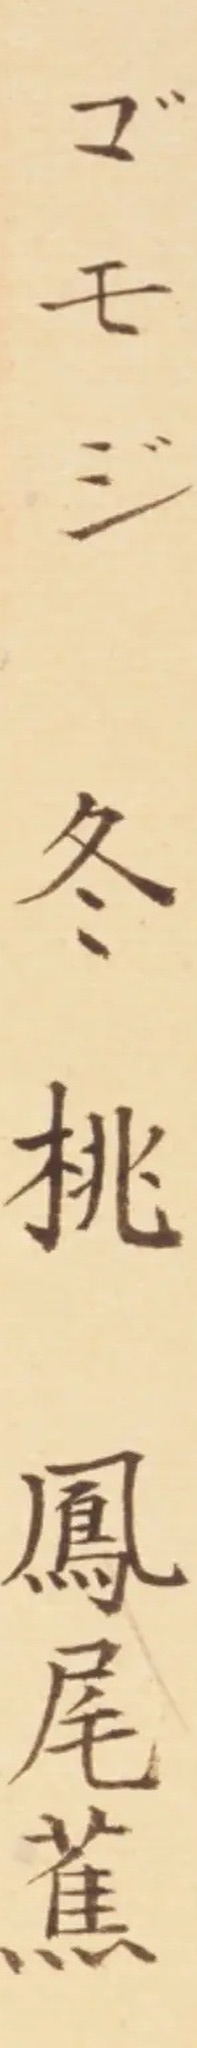ゴモジ冬桃鳳尾蕉
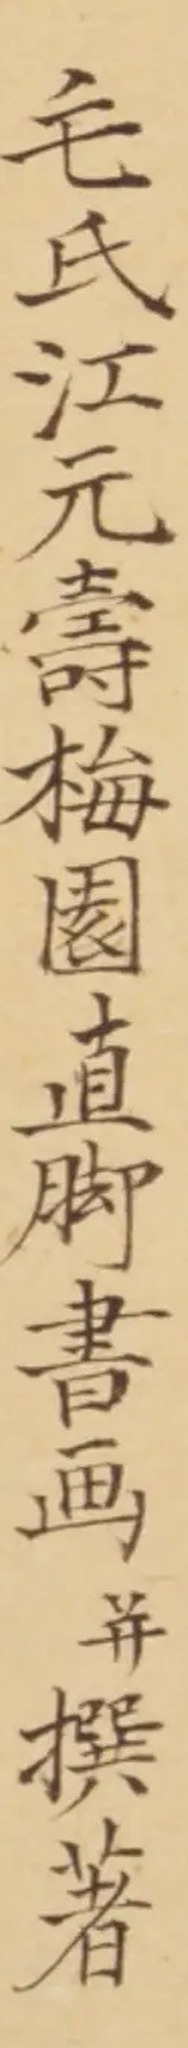毛氏江元寿梅園直脚書画并撰著

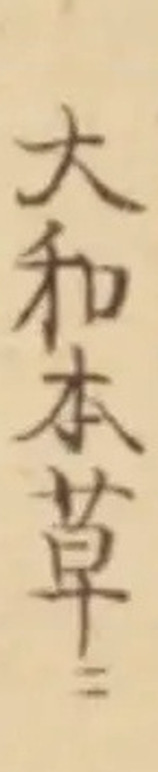大和本草ニ
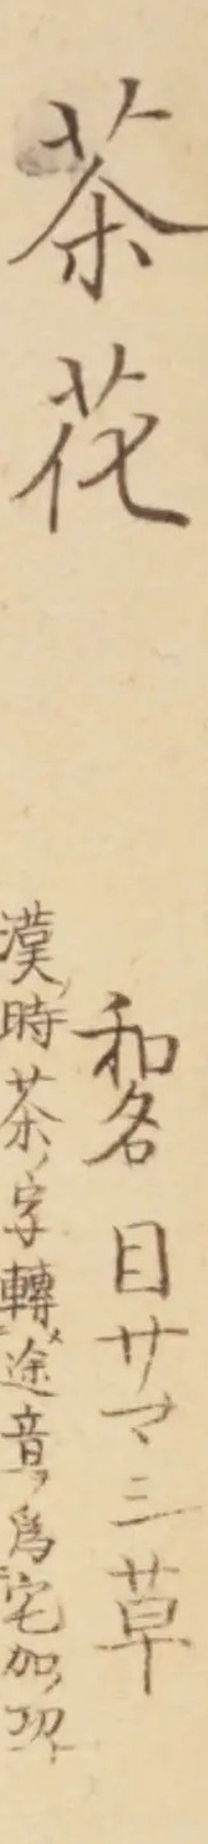茶花和名目サマシ草
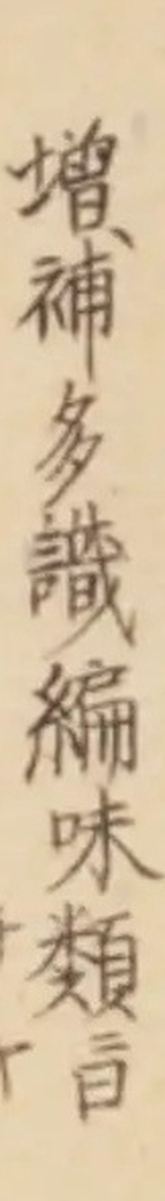増補多識編味類ニ曰
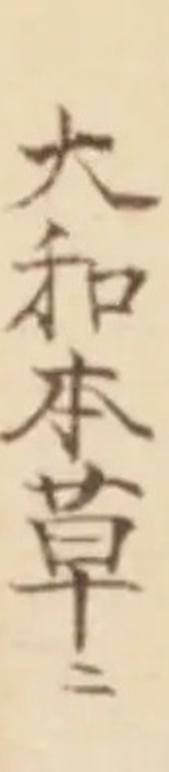大和本草ニ
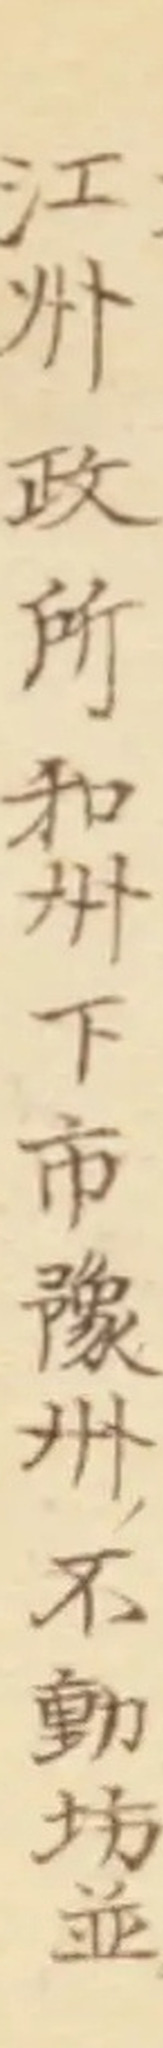江州政所和州下市豫州不動坊並
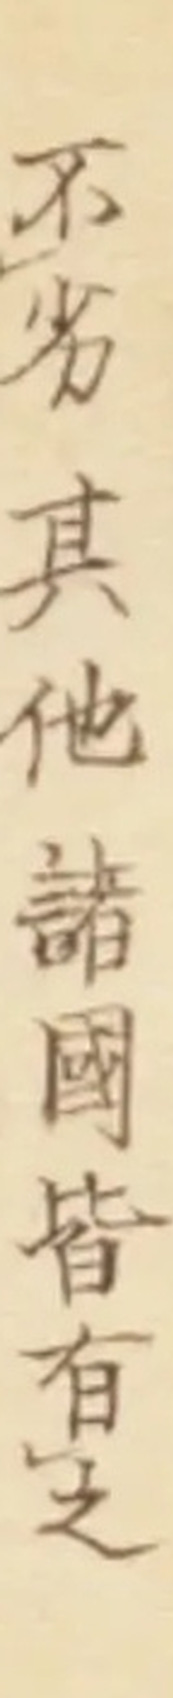不劣其他諸国皆有之
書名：梅園草木花譜冬之部
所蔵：国立国会図書館 National Diet Library, JAPAN
